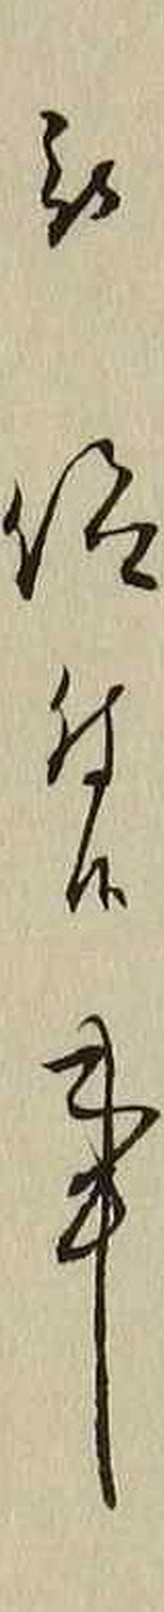被仰付候事
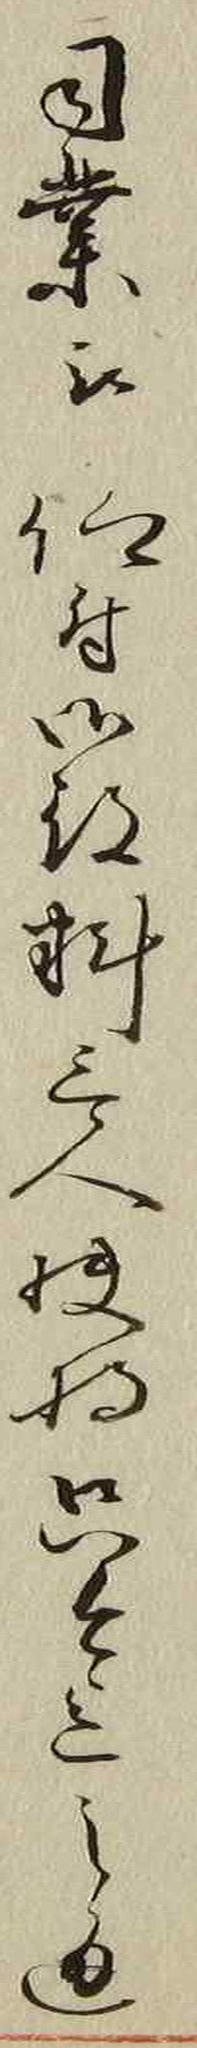司業被仰付御役料三人扶持只今迄之通
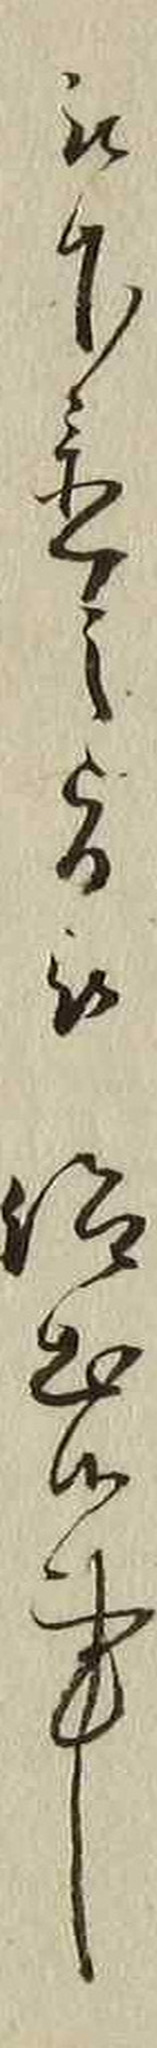被下置之旨被仰出候事
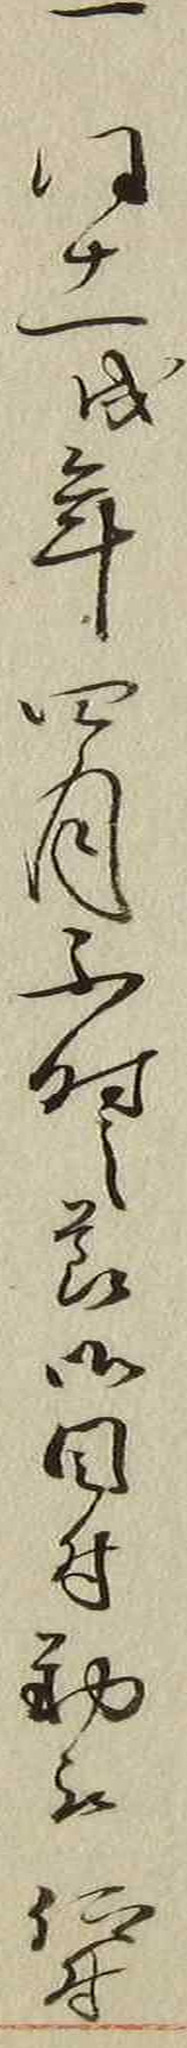一同十一戌年四月不時之節御目付勤被仰付
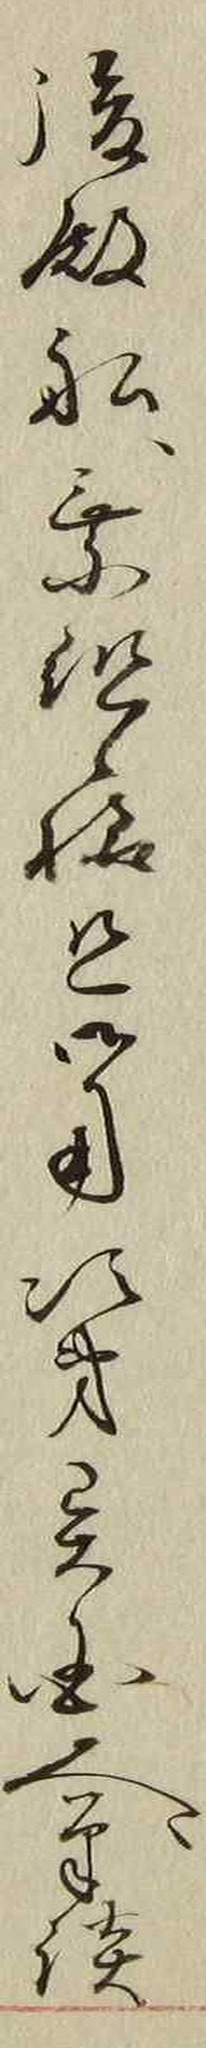後殿船へ乗組候様且御用次第異国人へ筆談
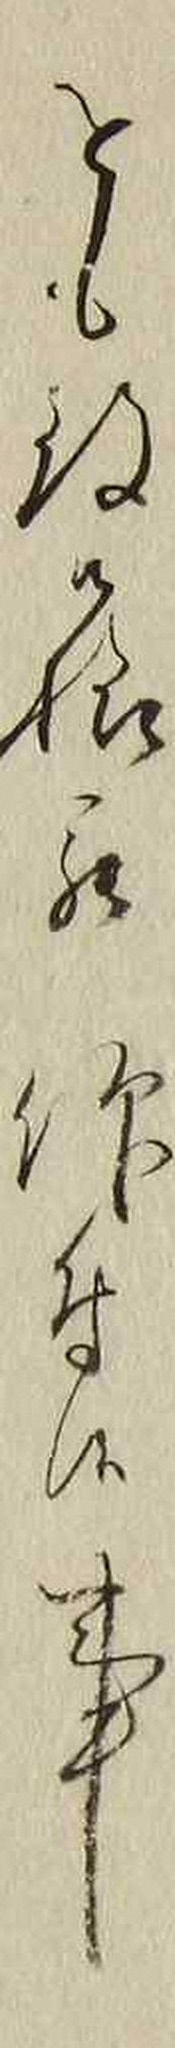をも致候様被仰付候事
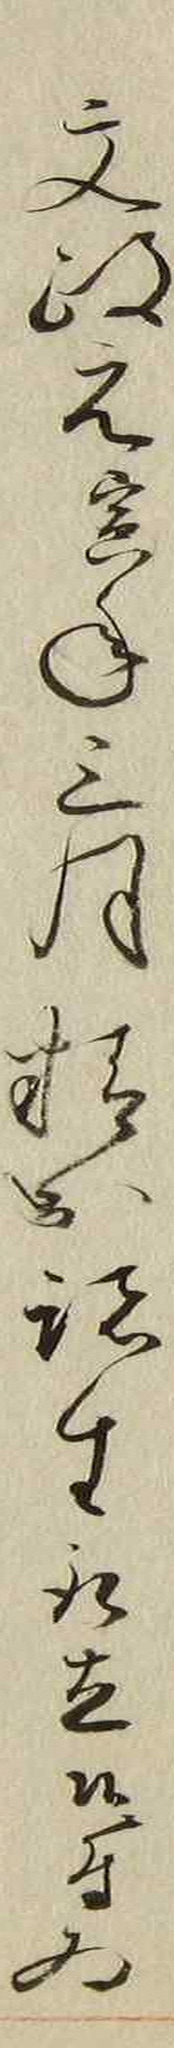一文政元寅年三月精出諸生取立候に付為
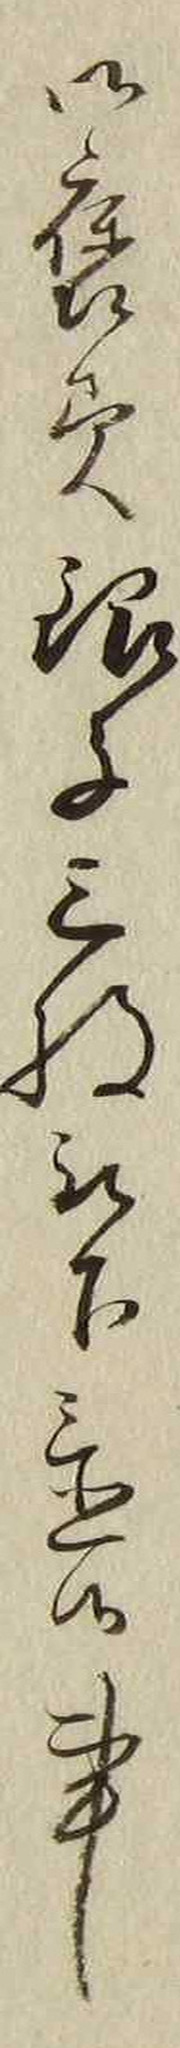御褒美銀子三枚被下置候事
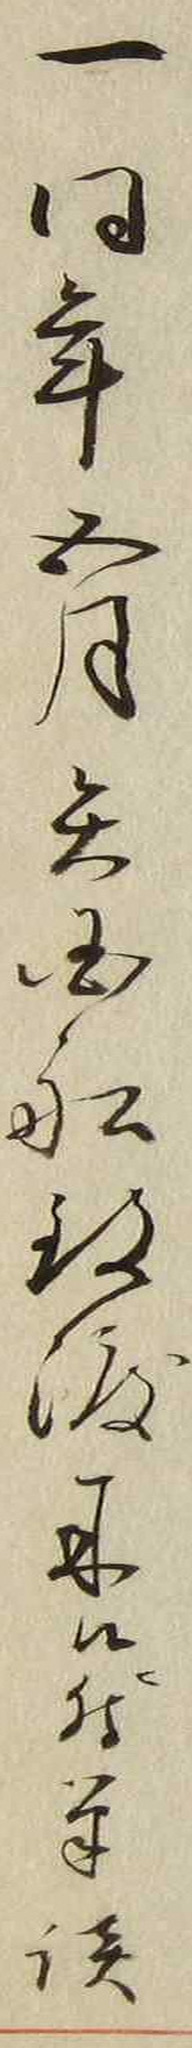一同年五月異国船渡来候に付筆談

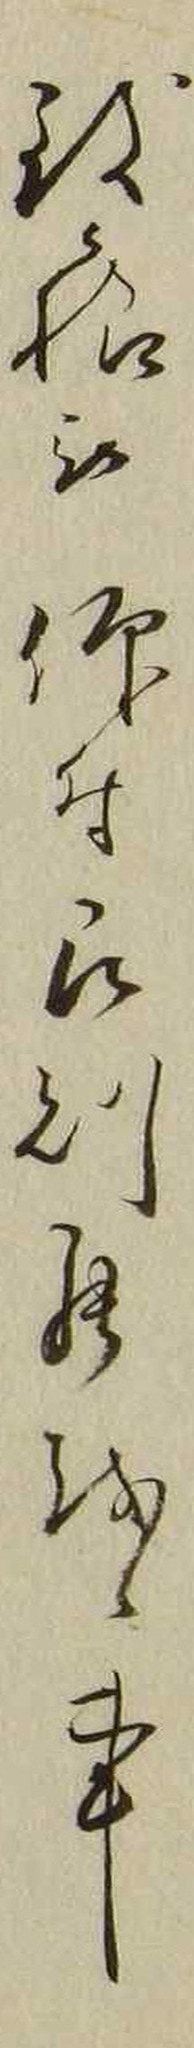致候様被仰付即刻罷越候事
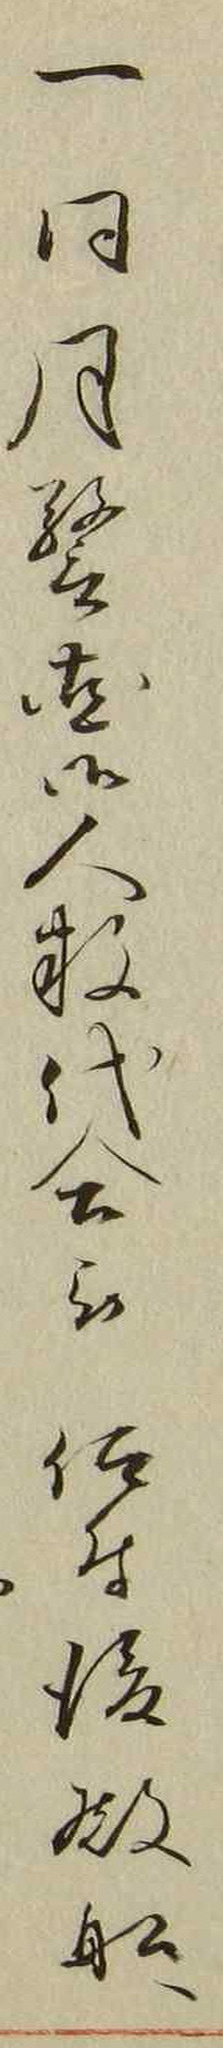一同月警固御人数代被仰付後殿船へ
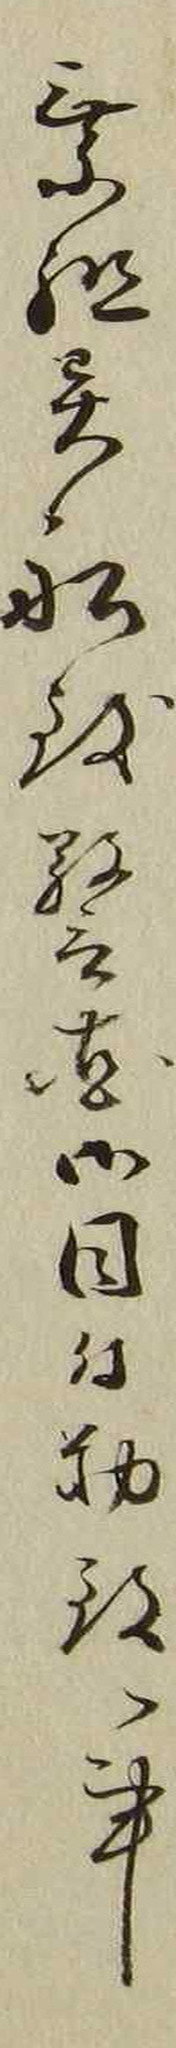乗組異船致警固御目付勤致候事
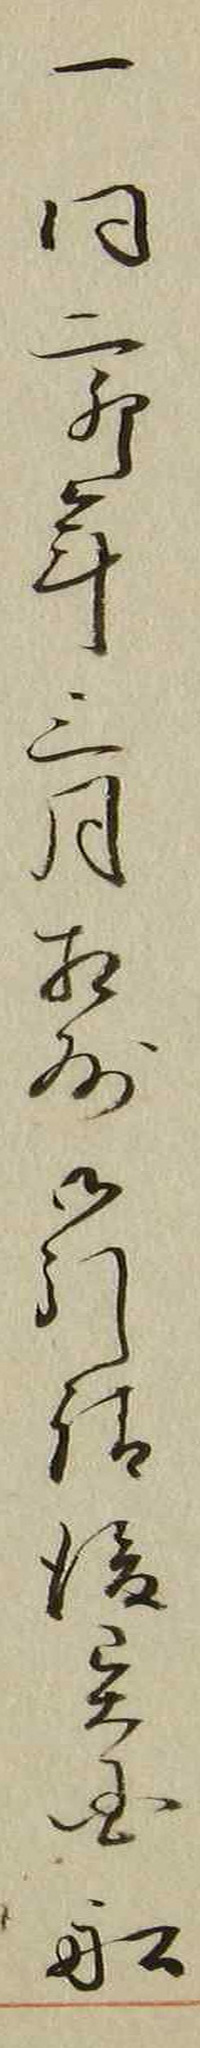一同二卯年三月相州御引請後異国船
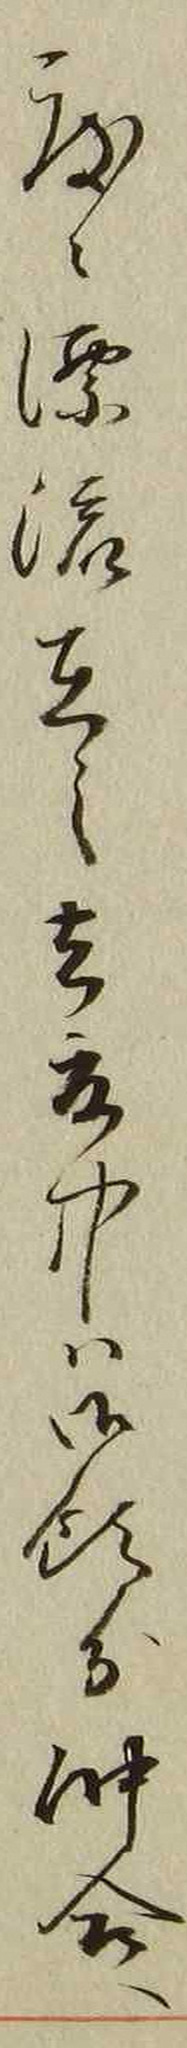度々漂流在之去夏中は御領分沖合へ
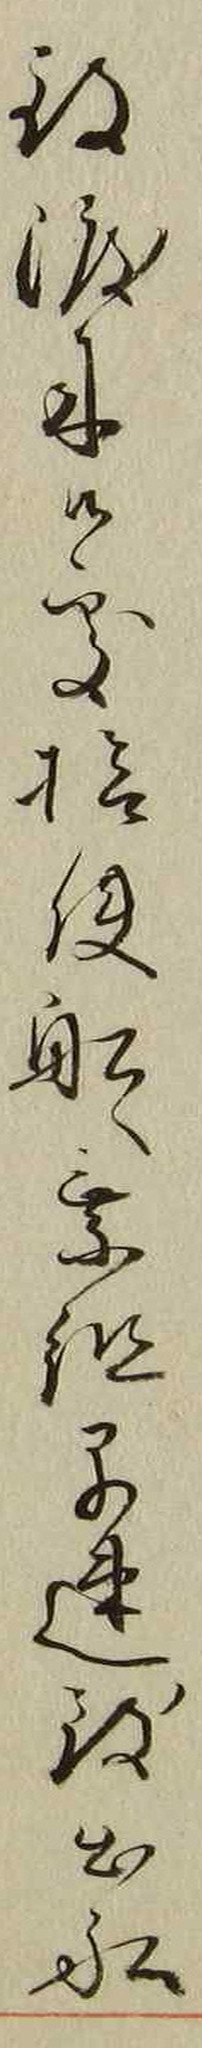致渡来候処検使船へ乗組早速致出船
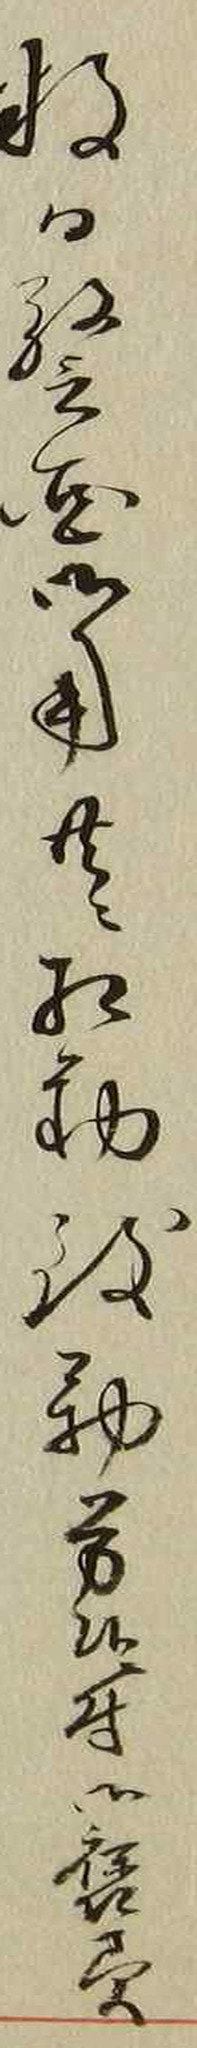数日警固御用共に相勤致勤労候に付御褒美
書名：諸士系譜　巻之3　い之部3
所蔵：会津若松市立会津図書館
